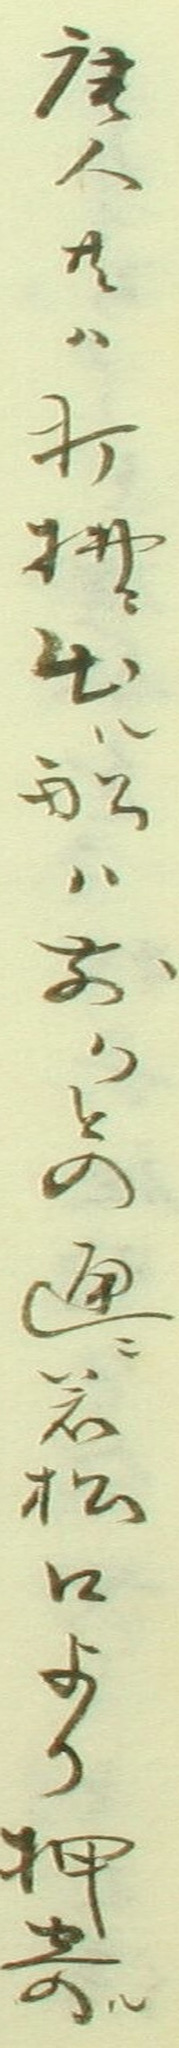唐人共は打払に出る船は前かとの通に若松口より押寄る
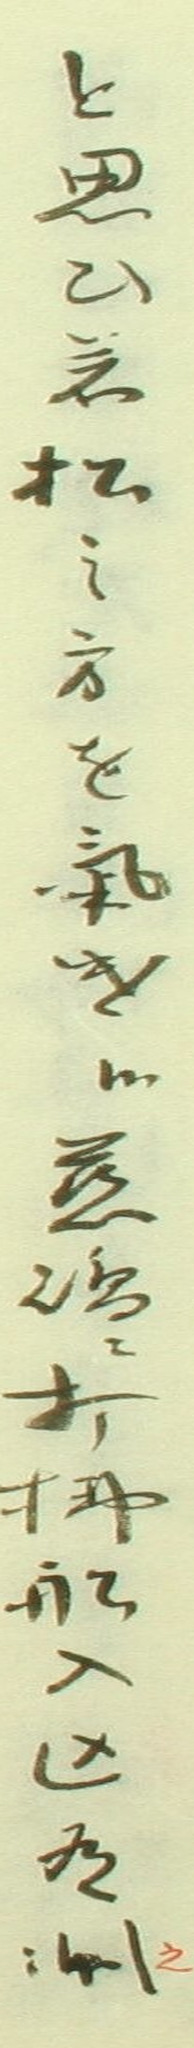と思ひ若松之方を気遣候慈嶋に打払船入区有之候
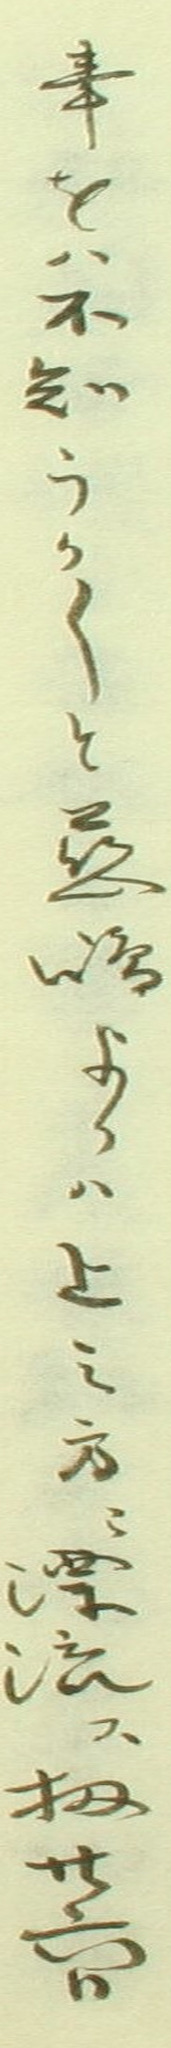事をは不知うかうかと慈嶋よりは上之方に漂流す扨廿六日
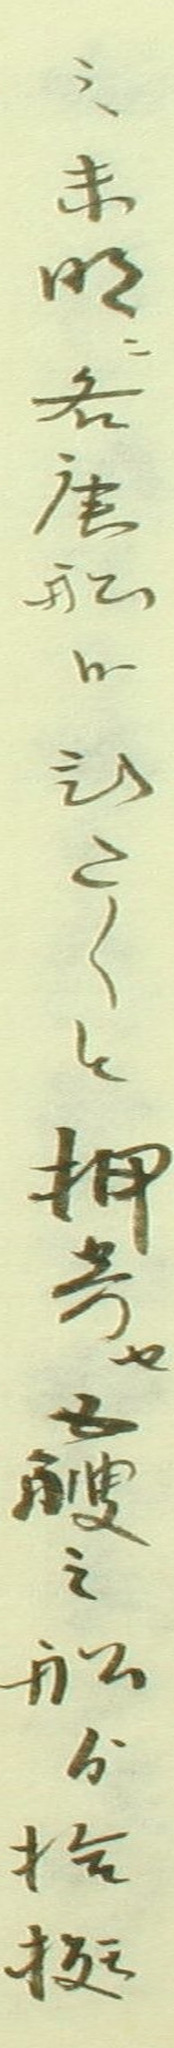之未明に各唐船ゟひたひたと押寄せ五艘之船ゟ拾拠
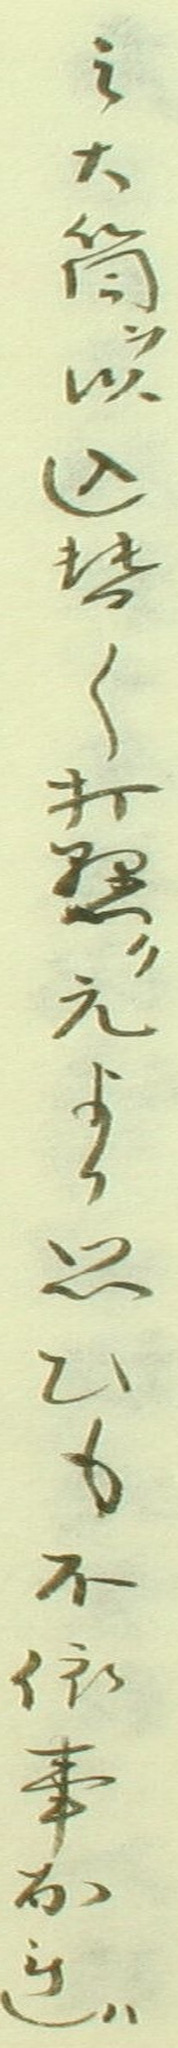之大筒を以込替込替打懸り元より思ひも不依事なれは
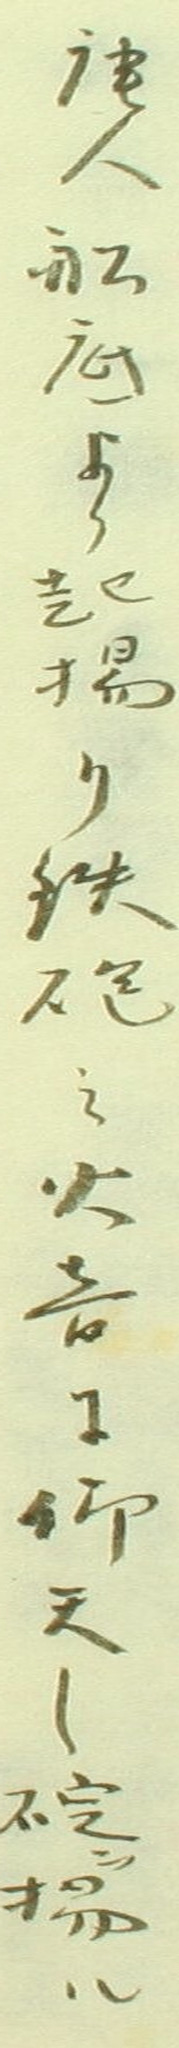唐人船底より起揚り鉄砲之火音に仰天し碇を揚る
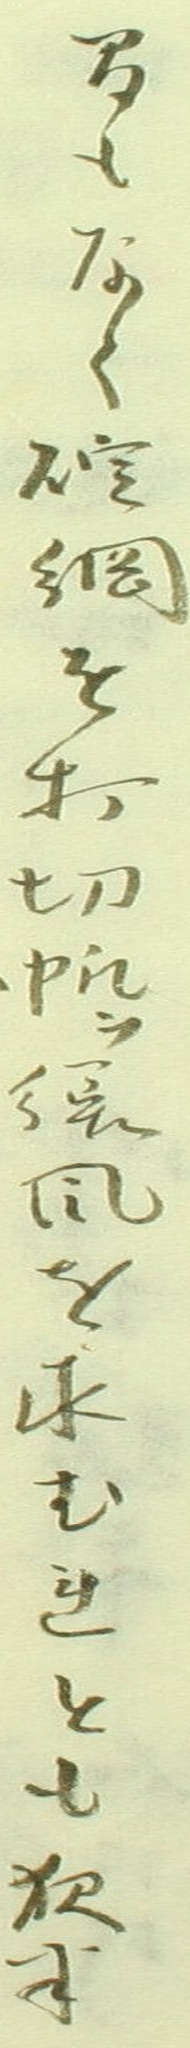間もなく碇綱を打切帆を？風を求むれとも夜半
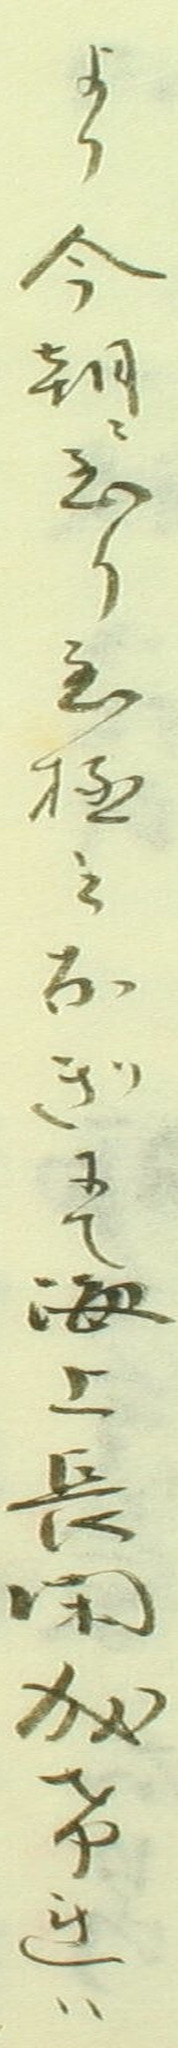より今朝に至り至極之なぎにて海上長閑成けれは
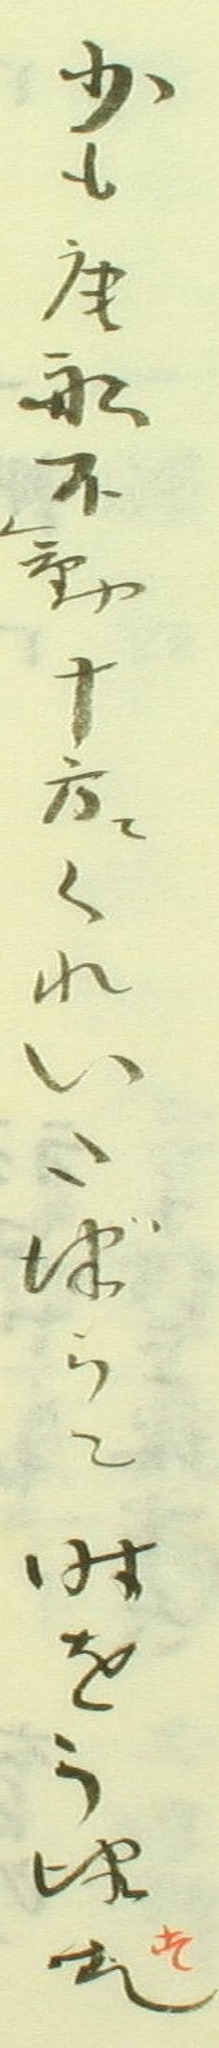少も唐船不動十方にくれいたづらに時をう埋氐
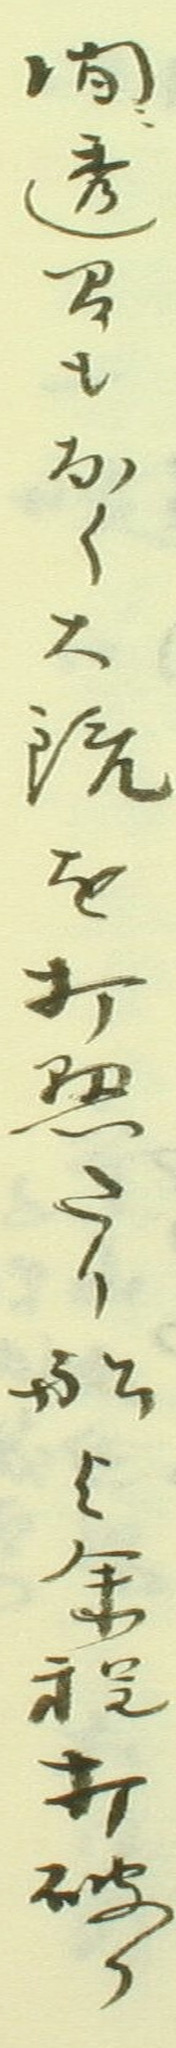間に透間もなく大院を打懸たり船は余程打破り
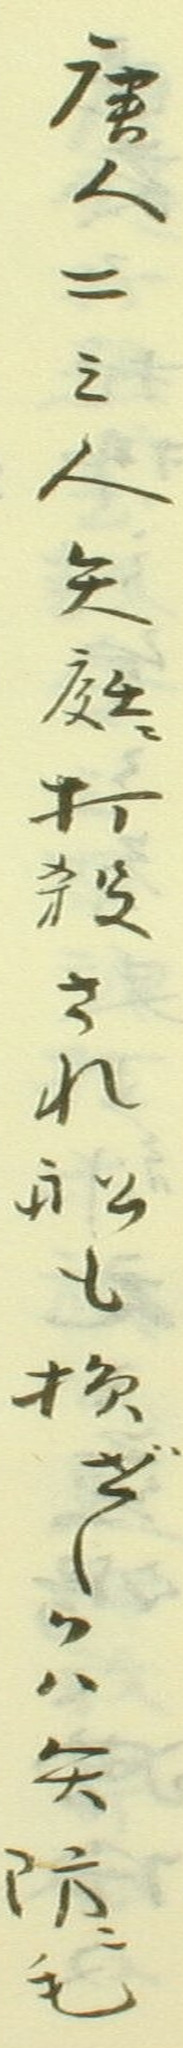唐人二三人矢庭に打殺され船も損ぜしかは矢防に毛
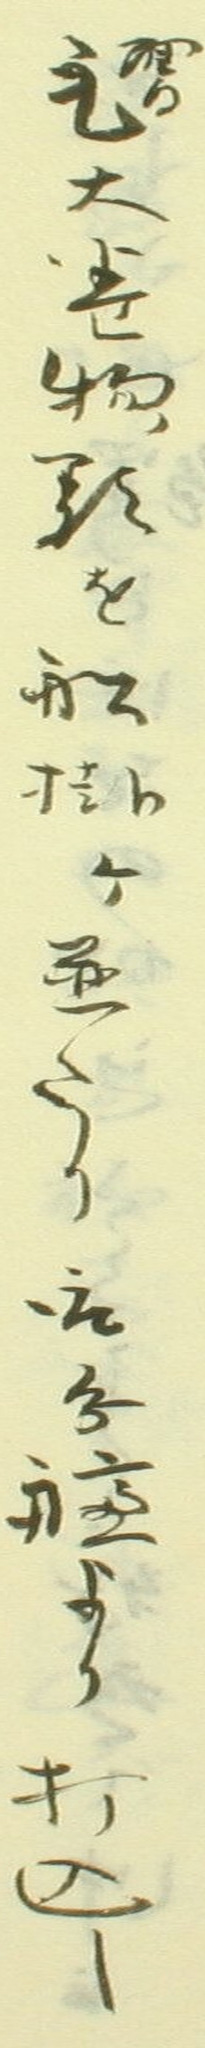氈大よせ物の類を船掛け置たり取分？より打込し
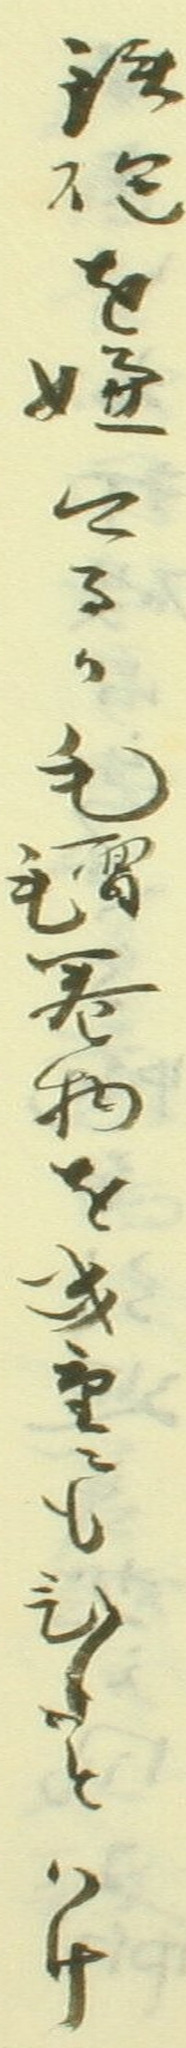鉄砲をふけるか毛氈巻物を弐重にもひしとかけ
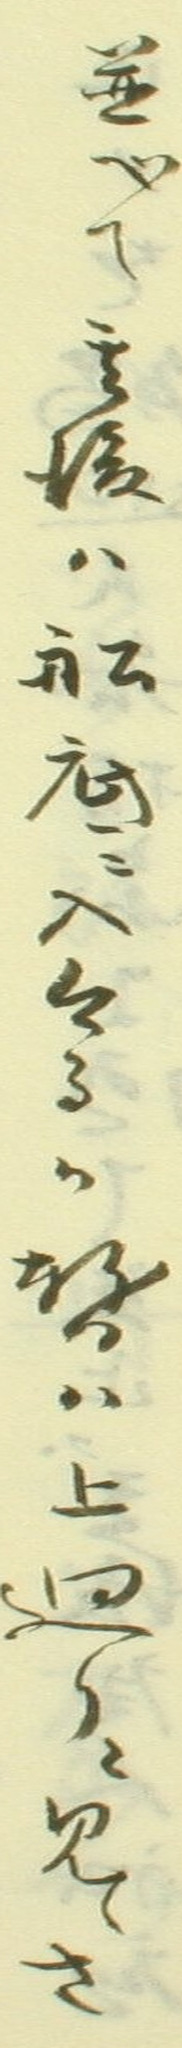並べて其後は船底に入けるか暫は上廻りに見へさ
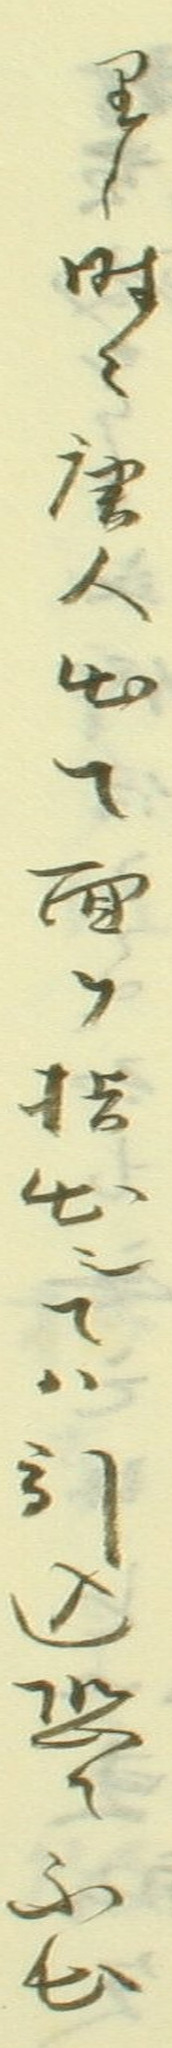りし時々唐人出て面を指出しては引込恐て不長
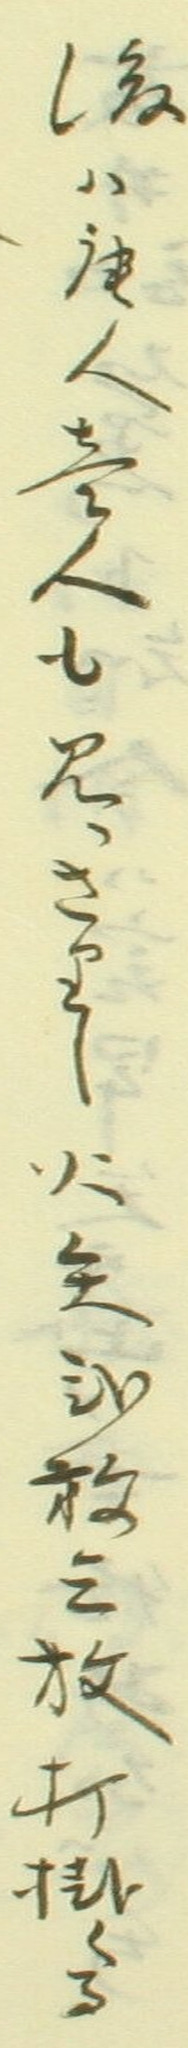後は唐人壱人も見へさりし火矢弐放三放打掛くる
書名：唐船漂流記 三
